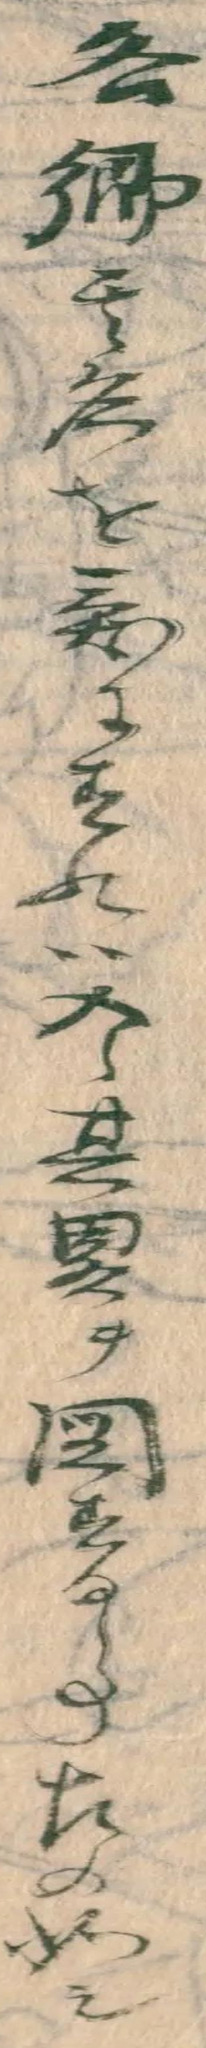各郷其名を異にすれハ今其略ヲ図する事左の如シ
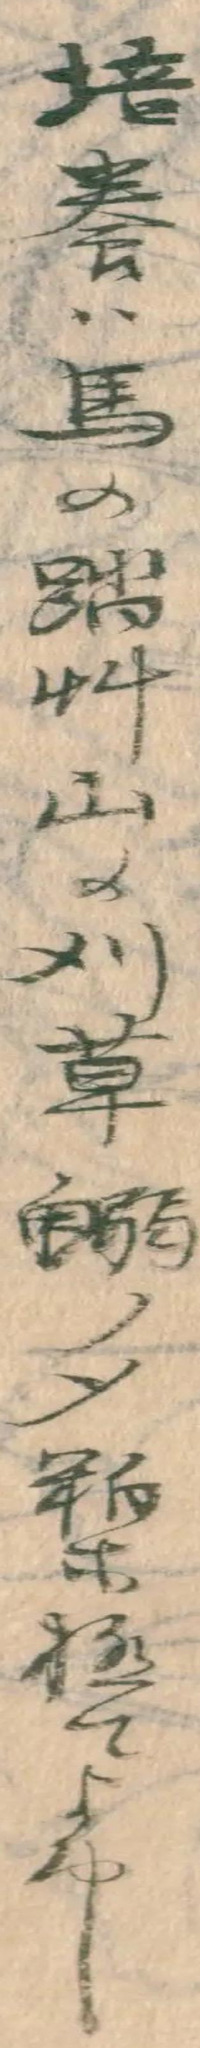培養ハ馬の踏草山の刈草鰯ノ〆粕等極てよろし

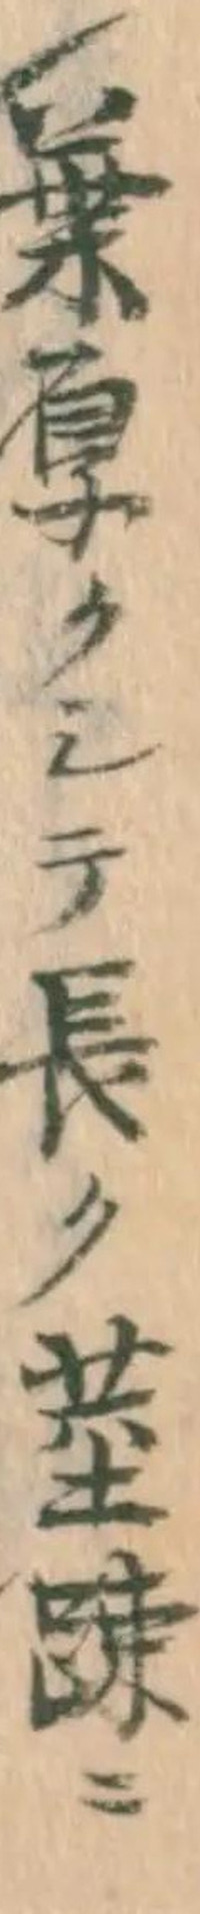葉厚クシテ長ク茎疎ニ
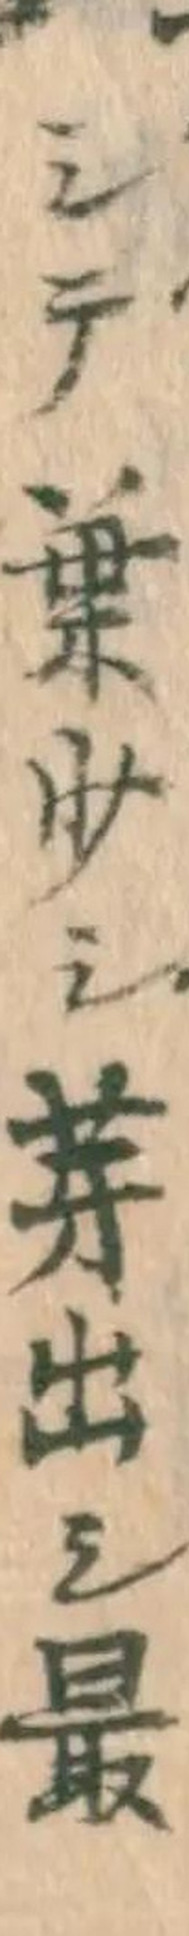シテ葉少シ芽出シ最
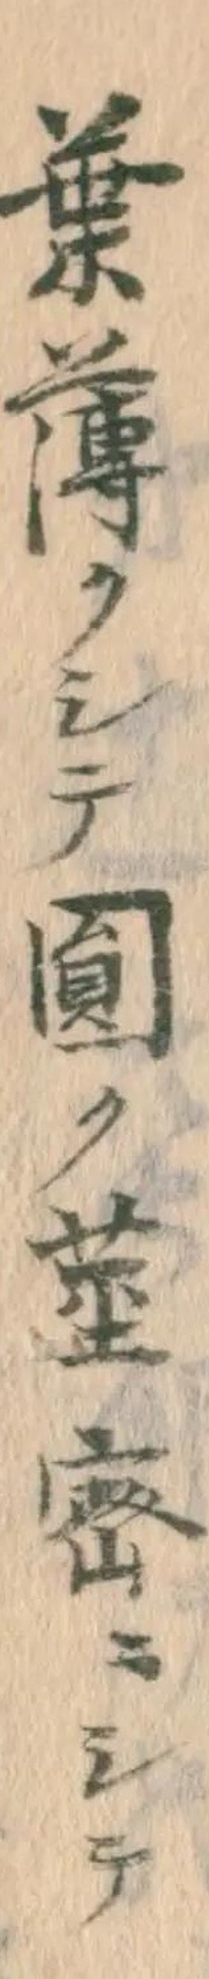葉薄クシテ円ク茎密ニシテ
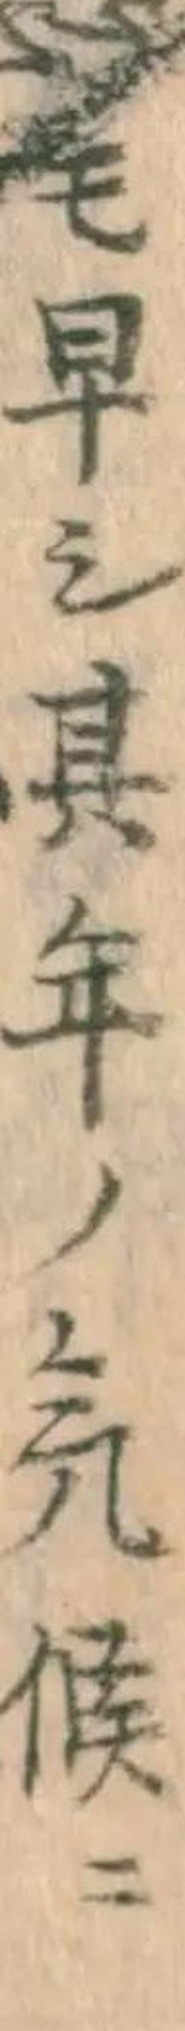モ早シ其年ノ気候ニ
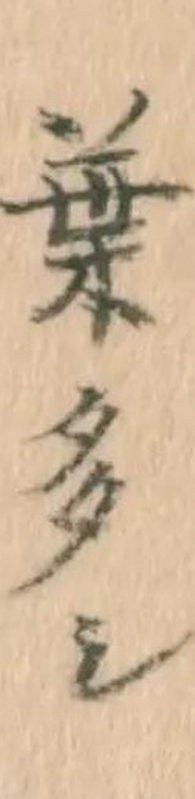葉多シ
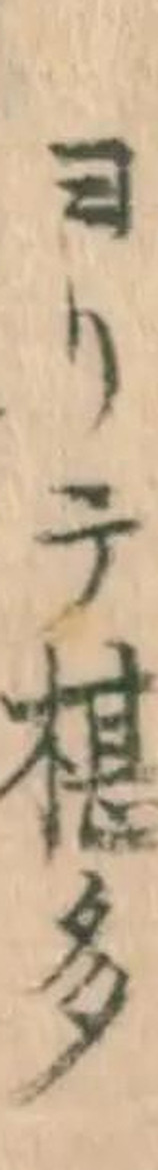ヨリテ椹多
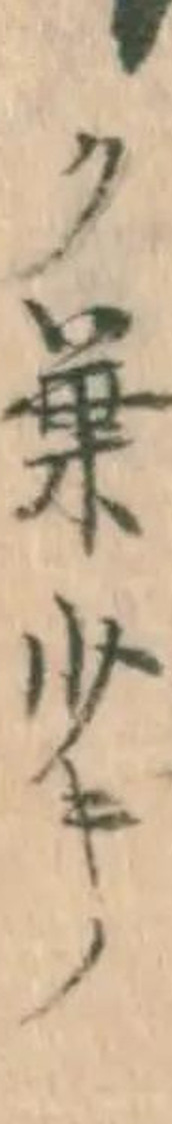ク葉少キノ
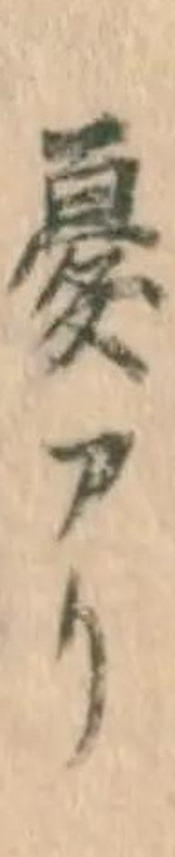憂アリ
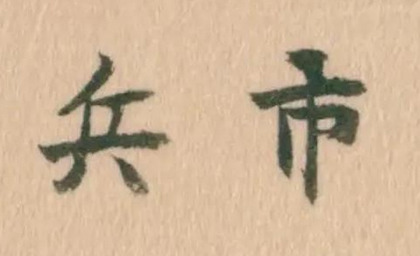市兵桑
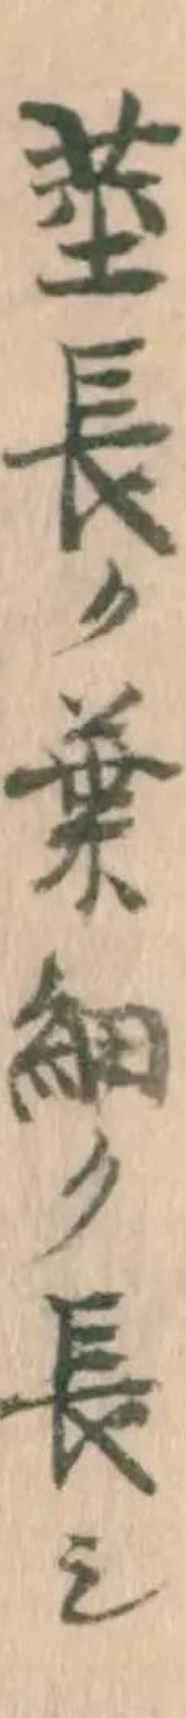茎長ク葉細ク長シ
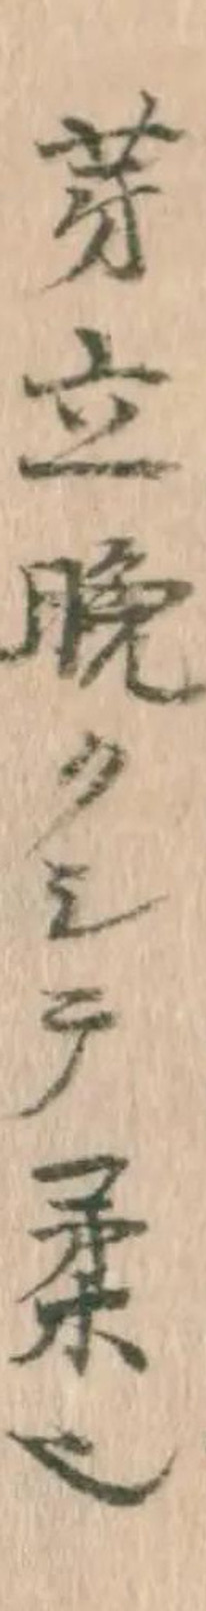芽立晩クシテ柔也
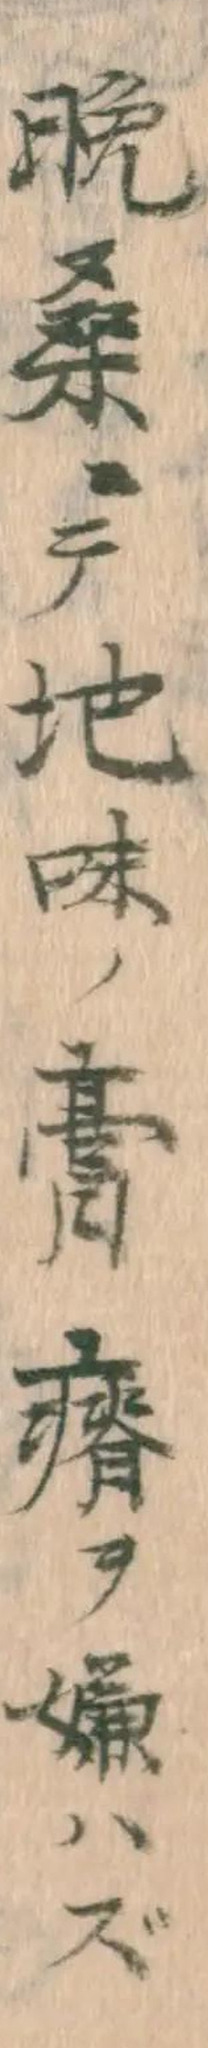晩桑ニテ地味ノ膏瘠ヲ嫌ハズ
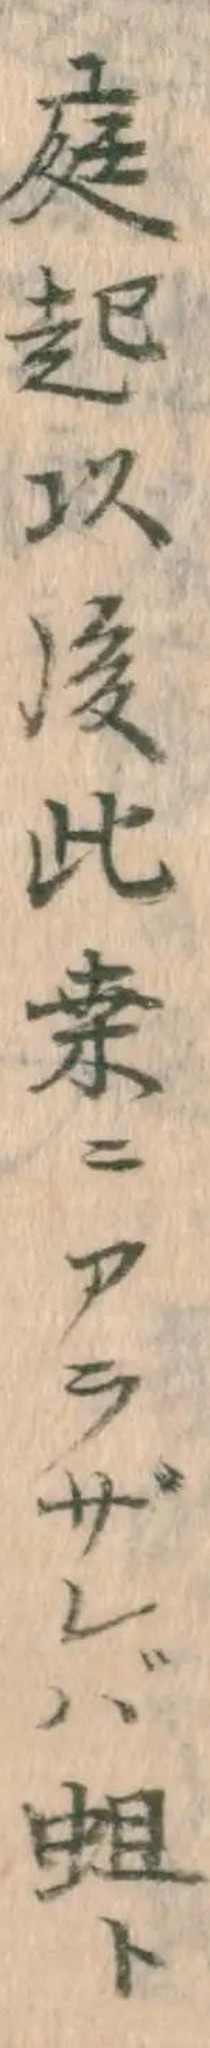庭起以後此桑ニアラザレバ蛆ト
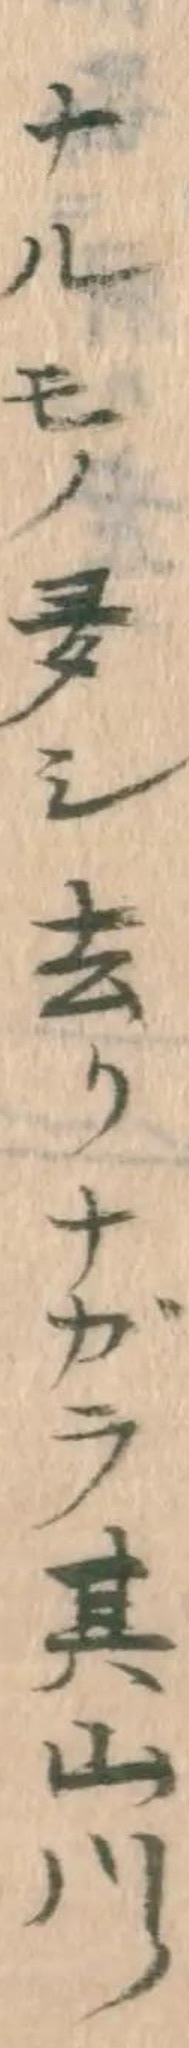ナルモノ多シ去リナガラ其山川ノ
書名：蚕桑集成
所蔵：国立国会図書館 National Diet Library, JAPAN
